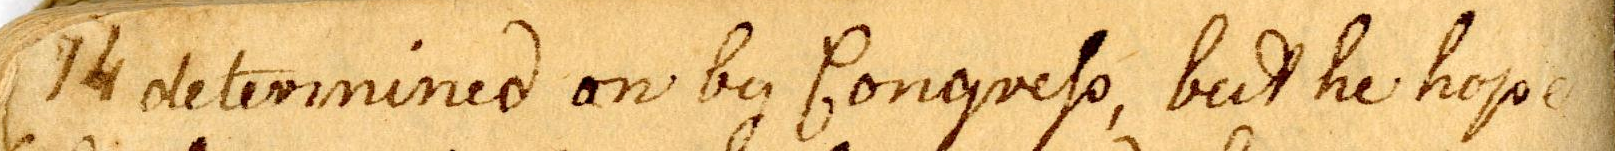74 determined on by Congress, but he hope
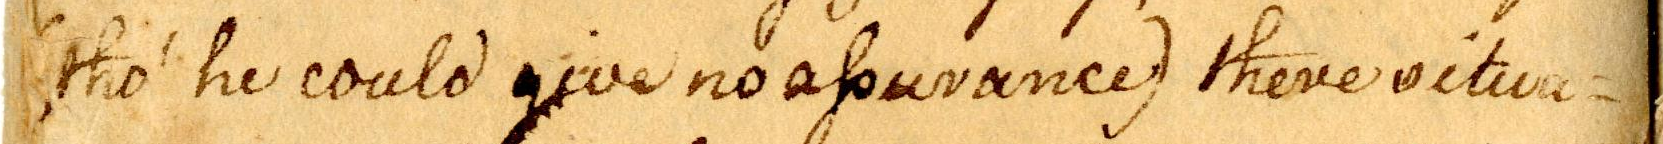(tho' he could give no assurance) there situa-
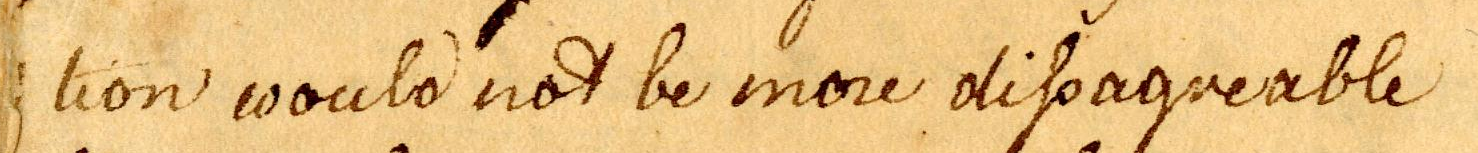-tion would not be more dissagreable
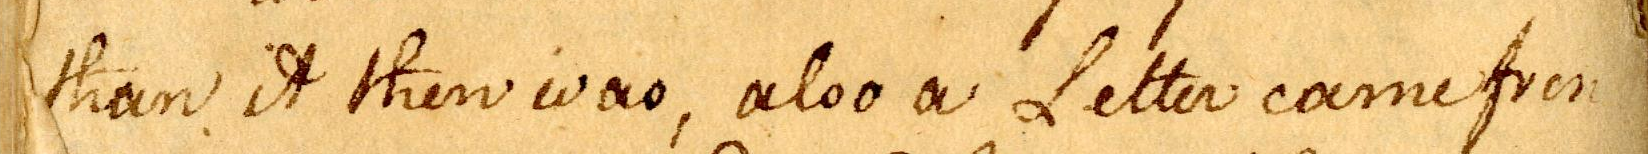than it then was, also a Letter came fron
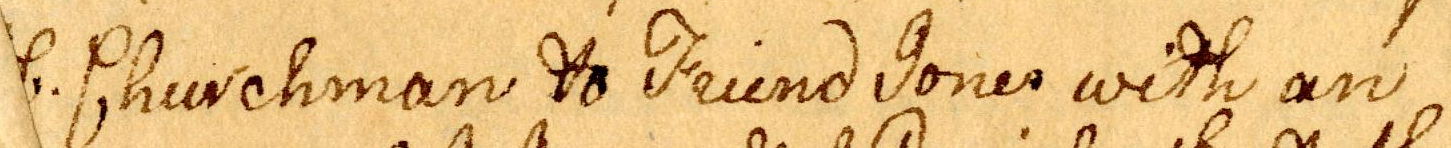Churchman to Friend Jones with an
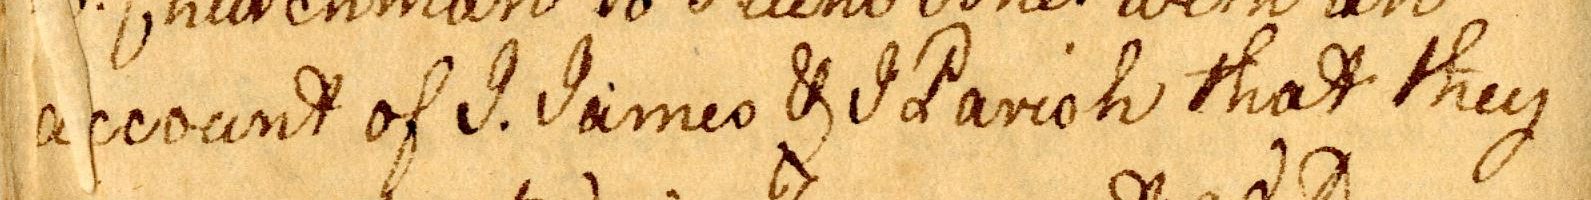account of J. James & J Parish that they
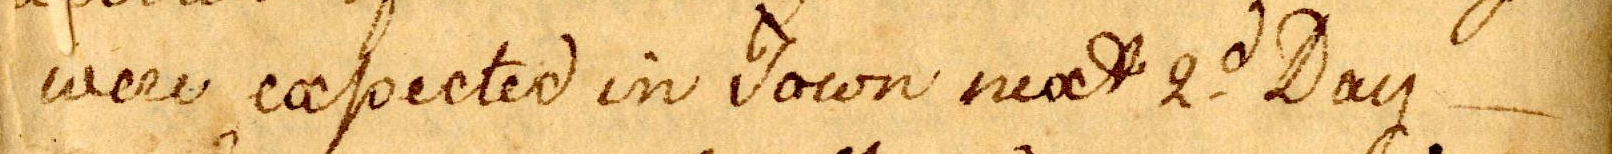were expected in Town next 2^d. Day
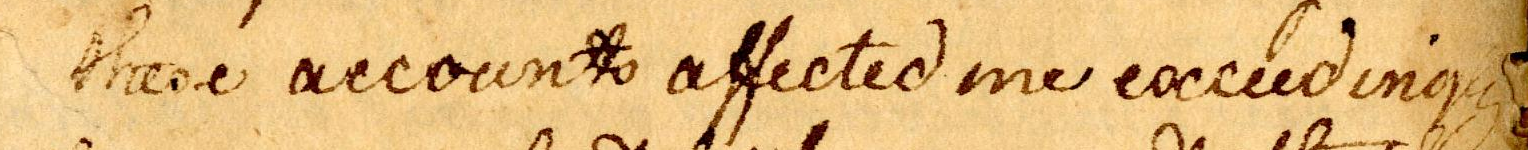these accounts affected me exceedingly
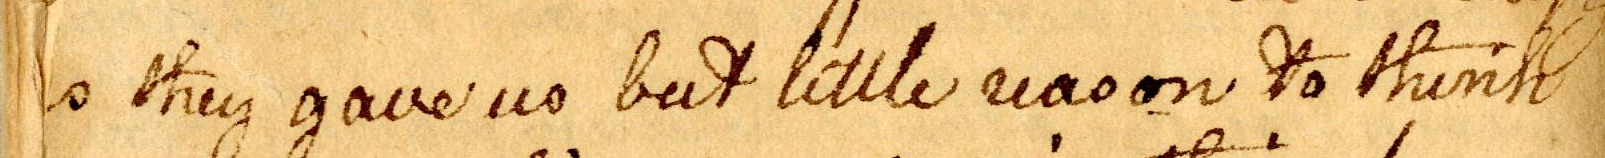s they gave us but little reason to think
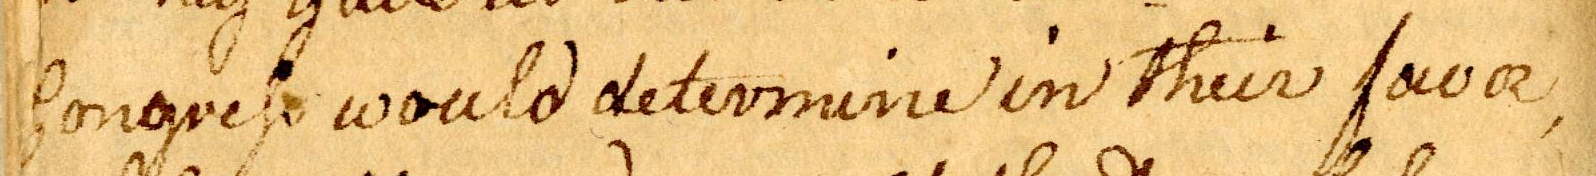Congress would determine in their favor,
